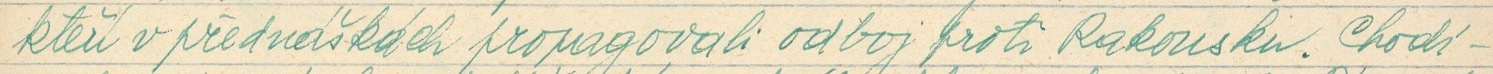kteří v přednáškách propagovali odboj proti Rakousku. Chodí-
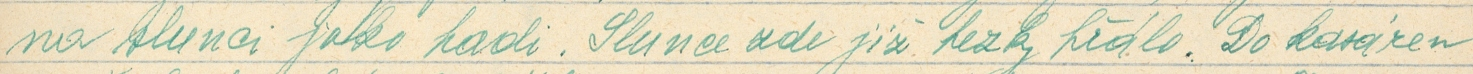na slunci jako hadi. Slunce zde již hezky hřálo. Do kasáren
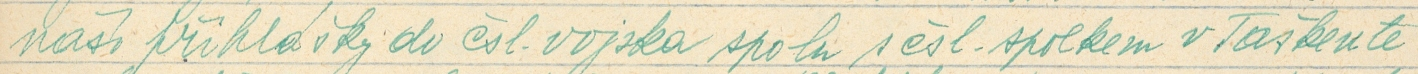naší přihlášky do čsl. vojska spolu s čsl. spolkem v Taškentě
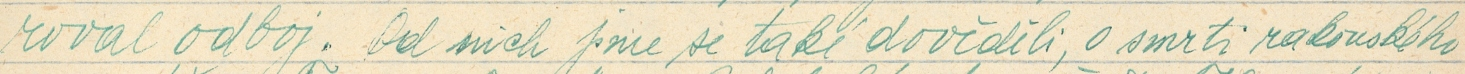roval odboj. Od nich jsme se také dověděli, o smrti rakouského
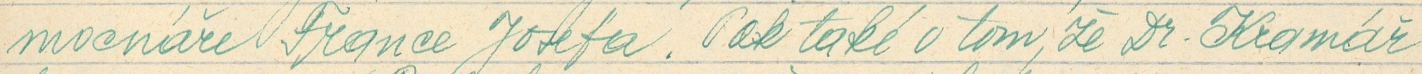mocnáře France Josefa. Pak také o tom, že Dr. Kramář
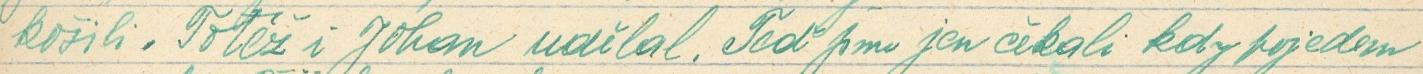košili. Totéž i Johan udělal. Teď jsme jen čekali kdy pojedem
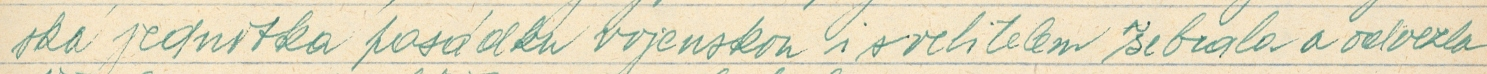ská jednotka posádku vojenskou i s velitelem sebrala a odvezla
